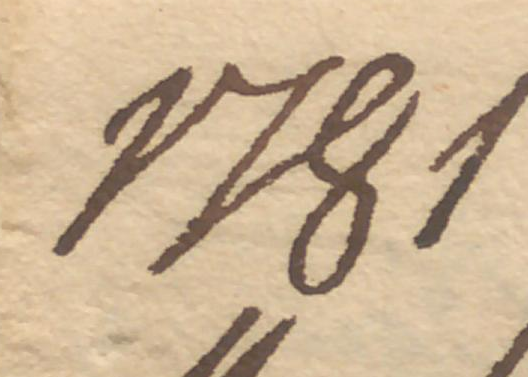1781
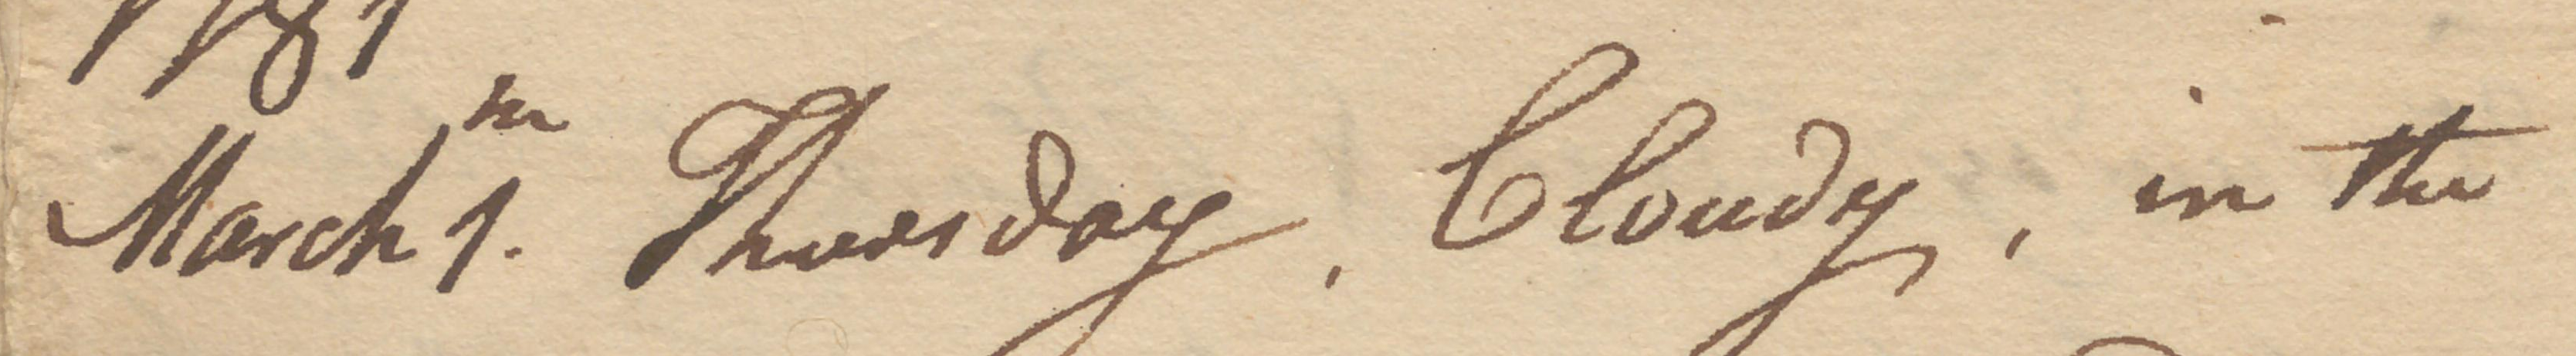March 1^th. Thursday Cloudy, in the
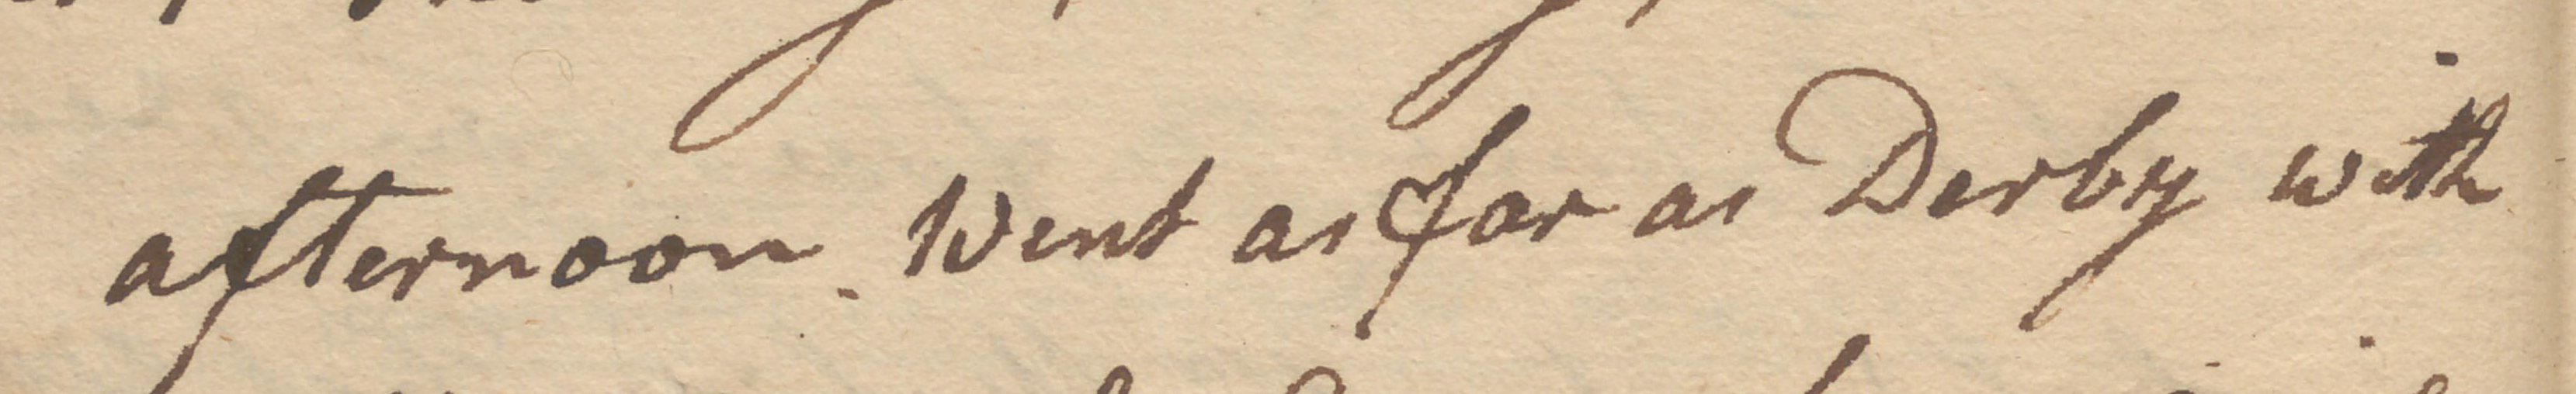afternoon went as far as Darby with
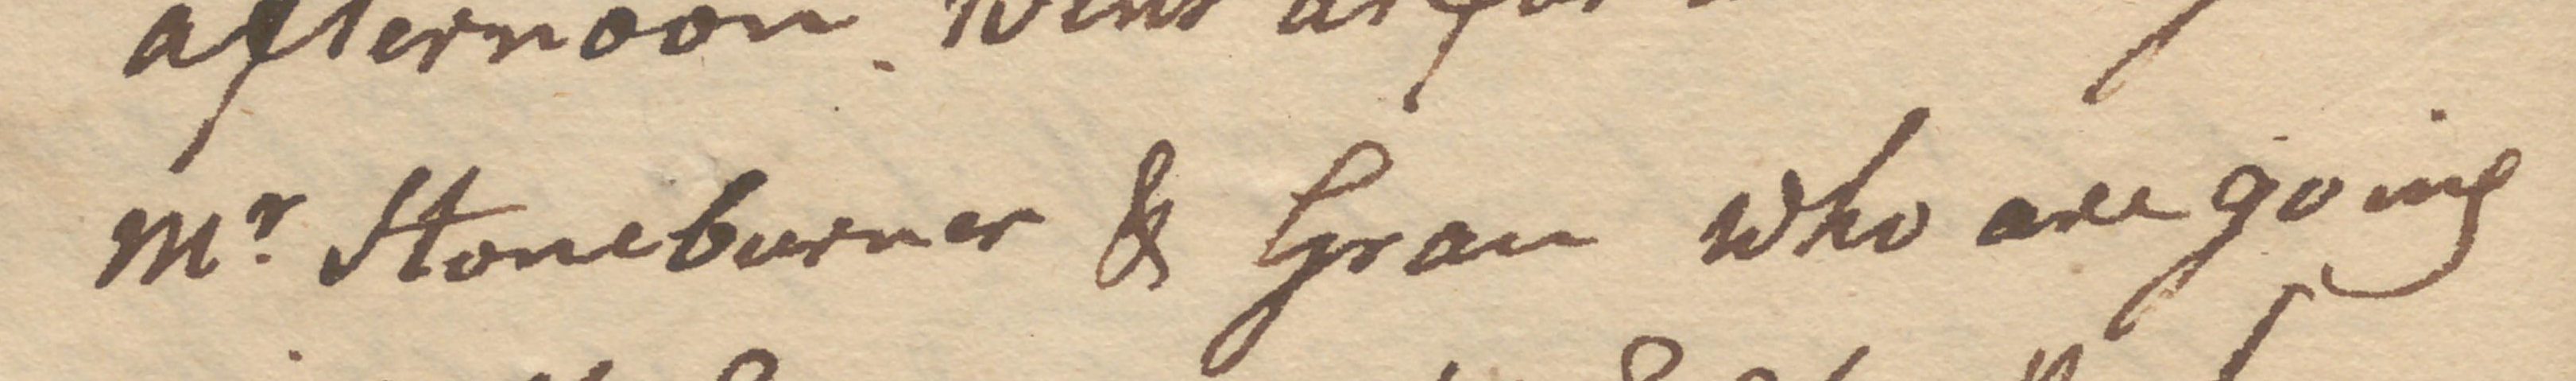M^r. Stoneburner & Grau who are going
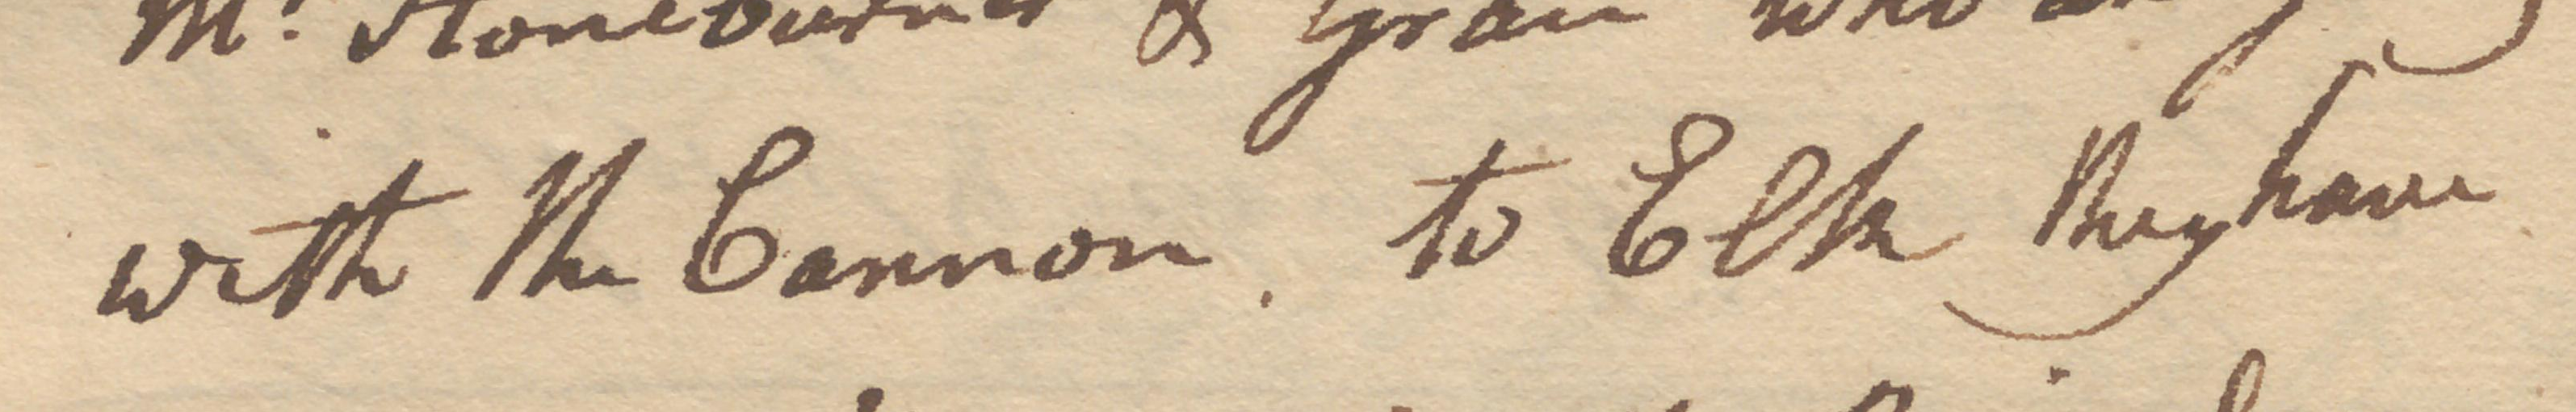with the Cannon to Elk they have
